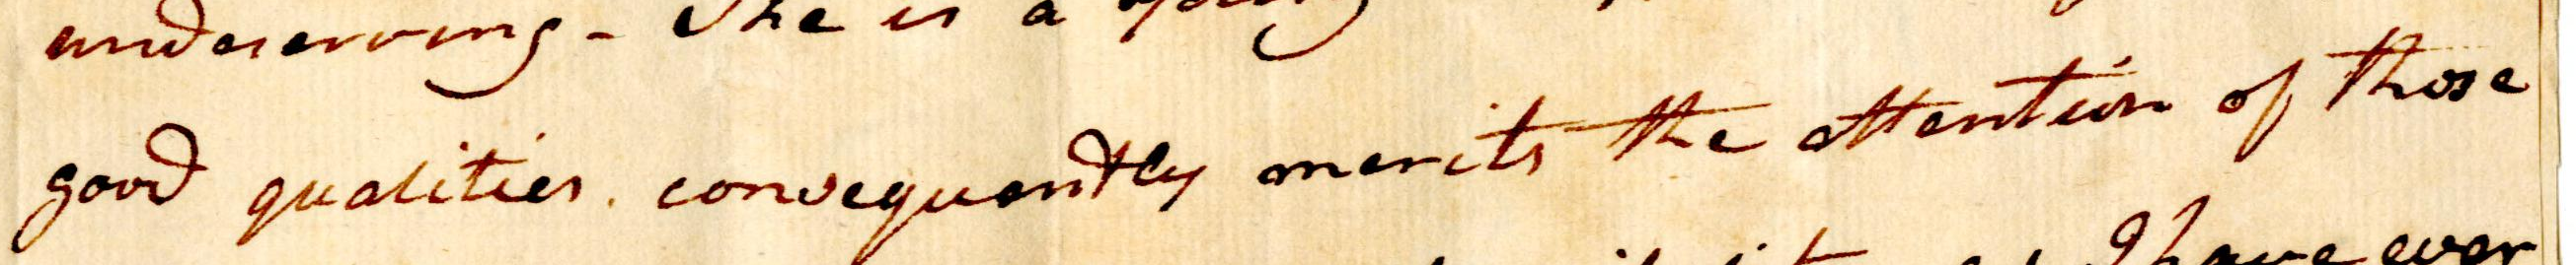good qualities consequently merits the attention of those
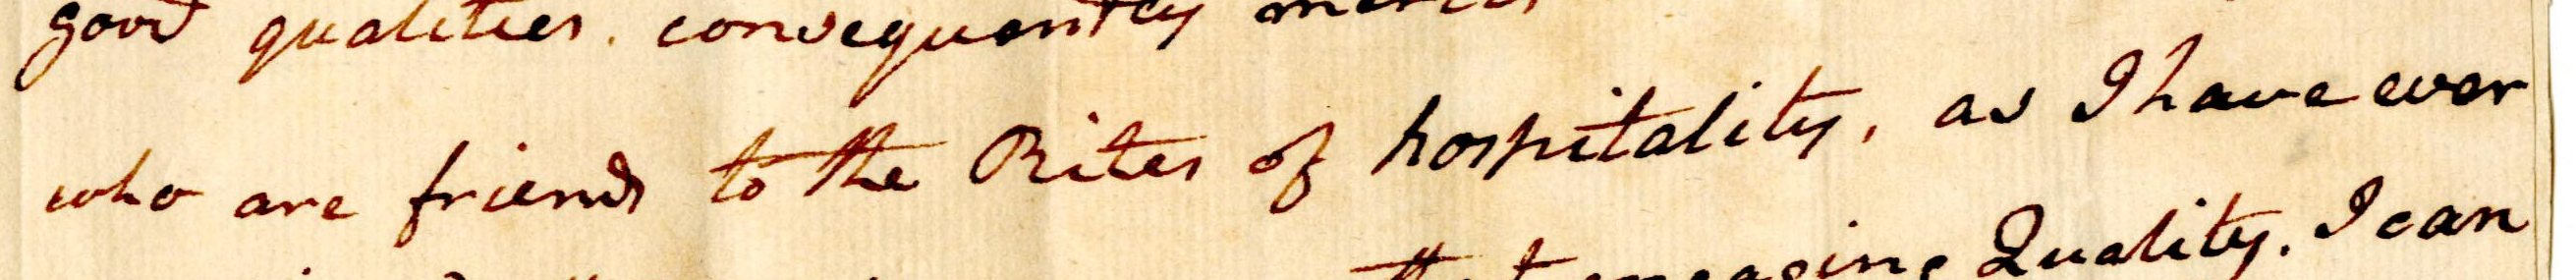who are friends to the Rites of hospitality, as I have ever
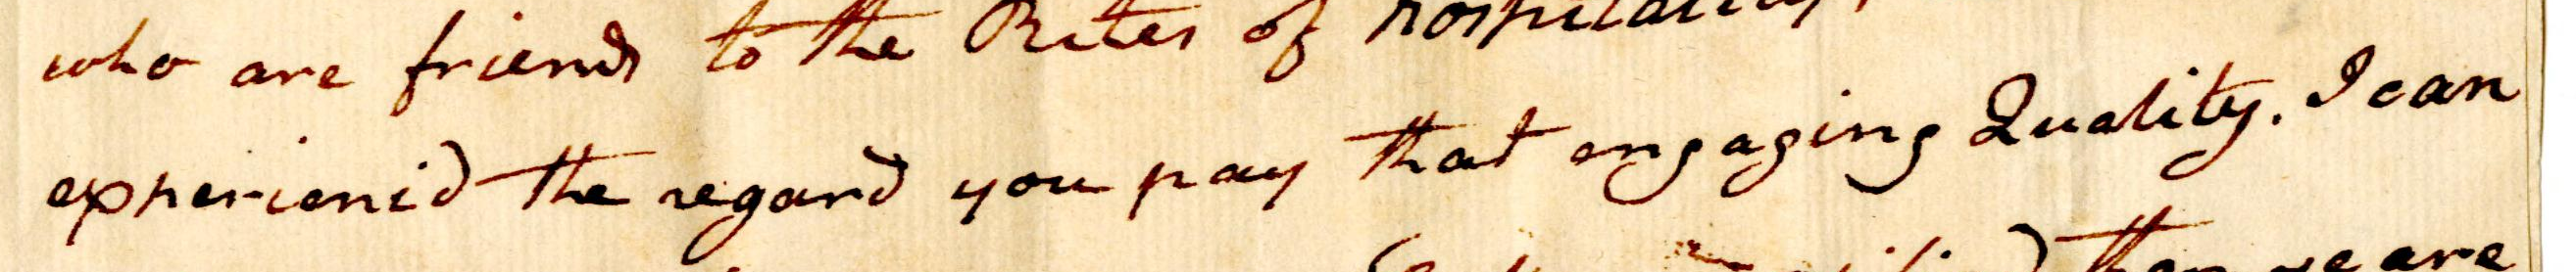experienc'd the regard you pay that engaging Quality. I can
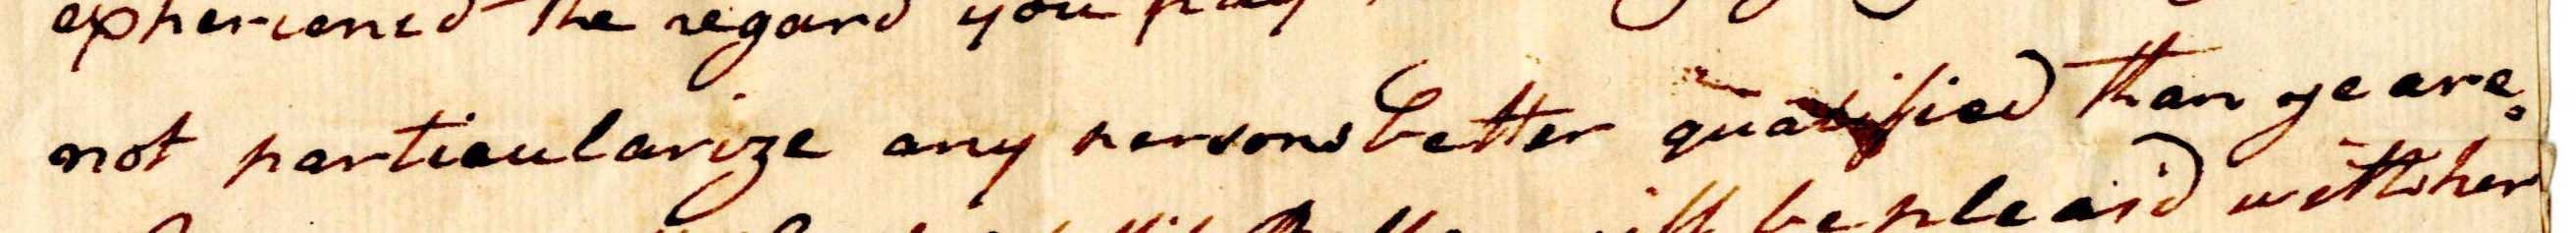not particularize any persons better qualified than years,
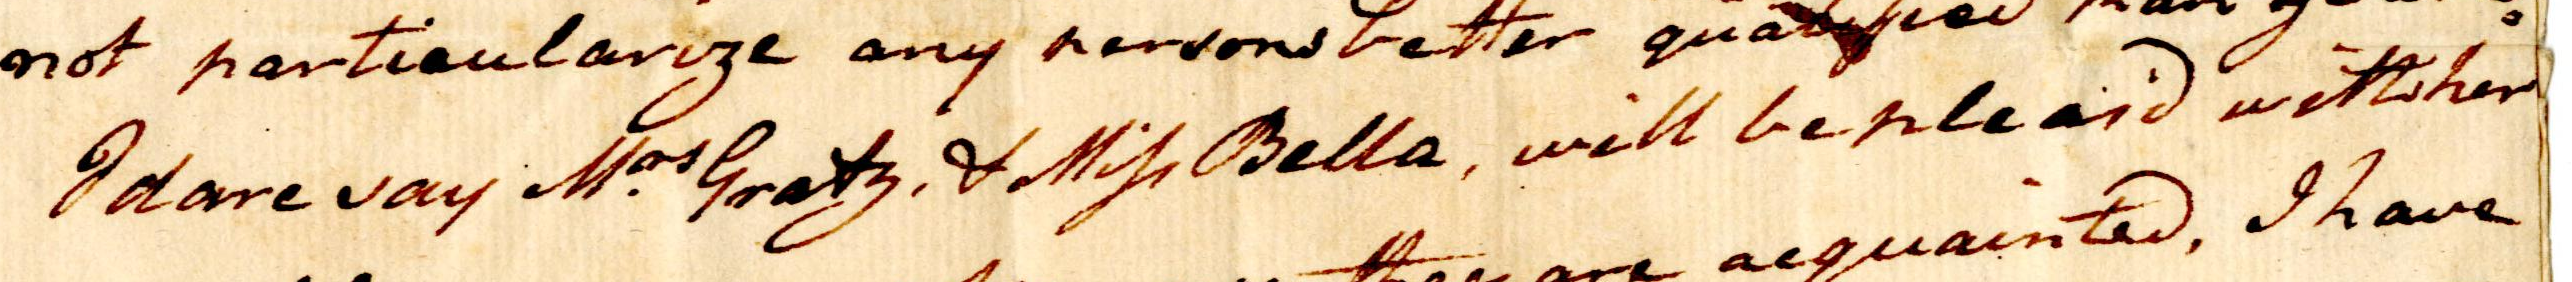I dare say M^rs. Gratz & Miss Bells, will be pleas'd with her
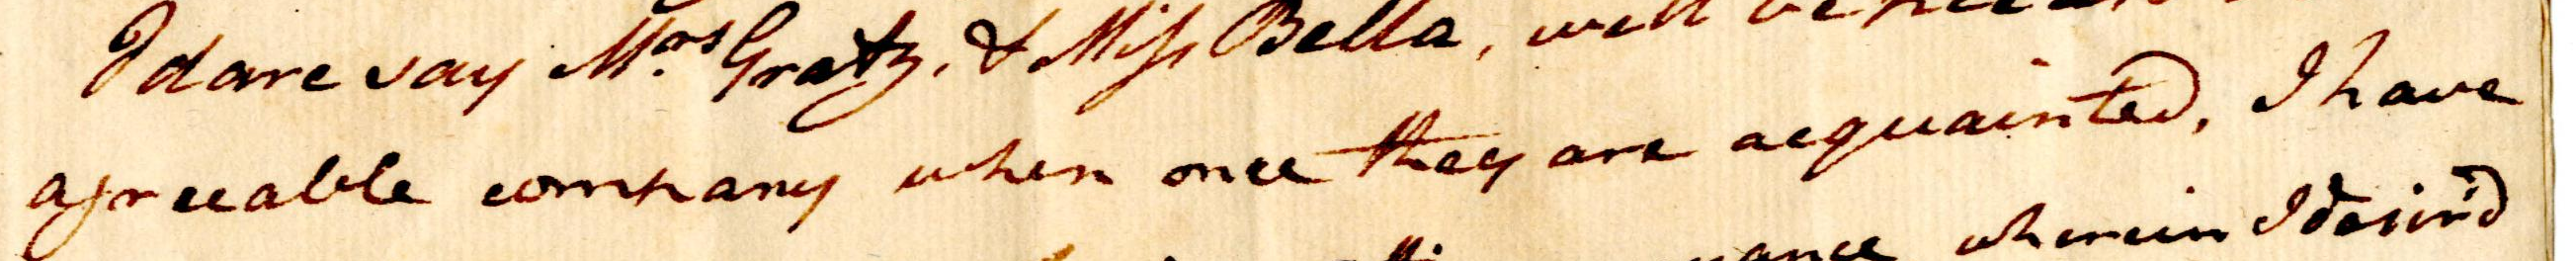agreeable company when once they are acquainted, I have
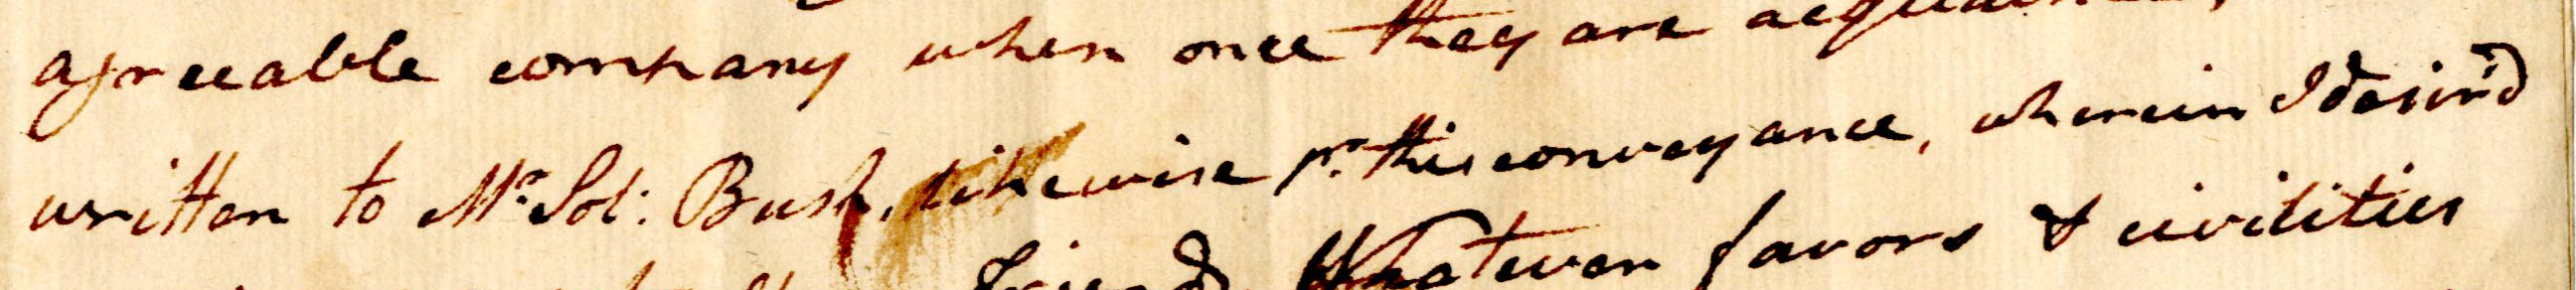written to M^r Sol: Bush. title wise per. this conveyance wherein I desir'd
